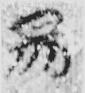昜（陽）
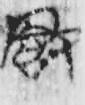○（厩）
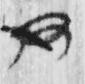尹
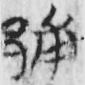郙
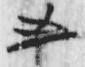之
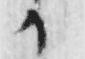人
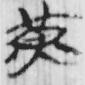黃
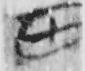甲
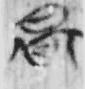晨
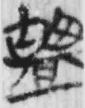○（盬）
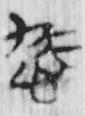○（求）
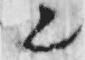乙
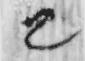乙
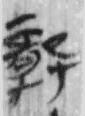龔
